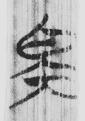{白矢}
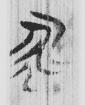永
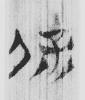保
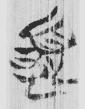{日又頁}
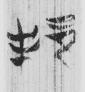邦
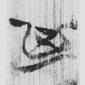𠀠
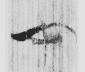才
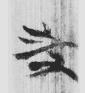寺
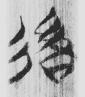{後口}
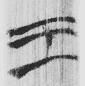王
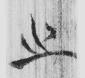之
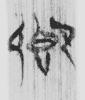卿
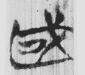或
